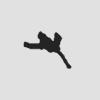又
